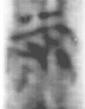兩
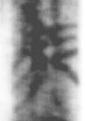馬
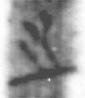之
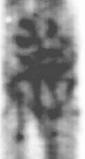○（轡）
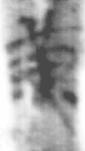黃
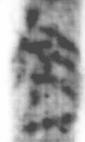金
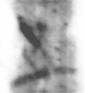之
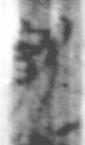勒
